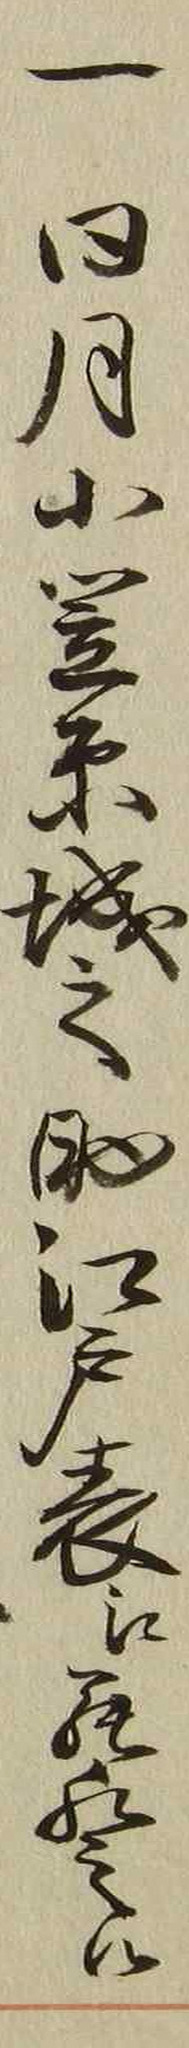一同月小笠原城之助江戸表江罷登候
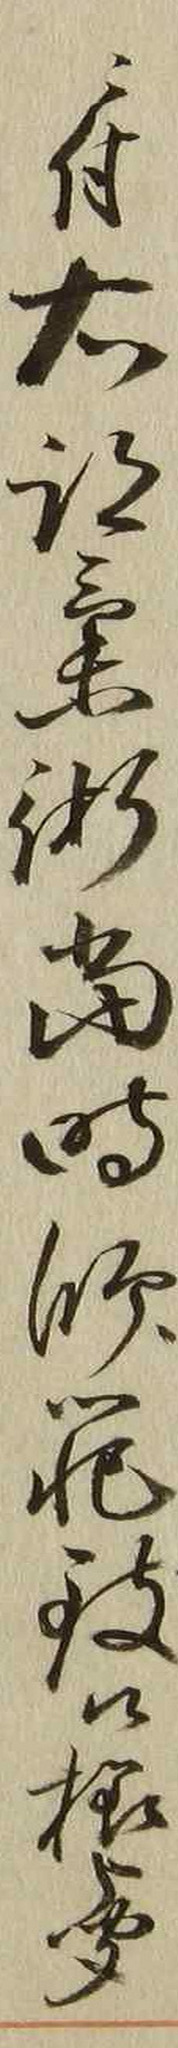ニ付右跡気術当時師範致候様被聞
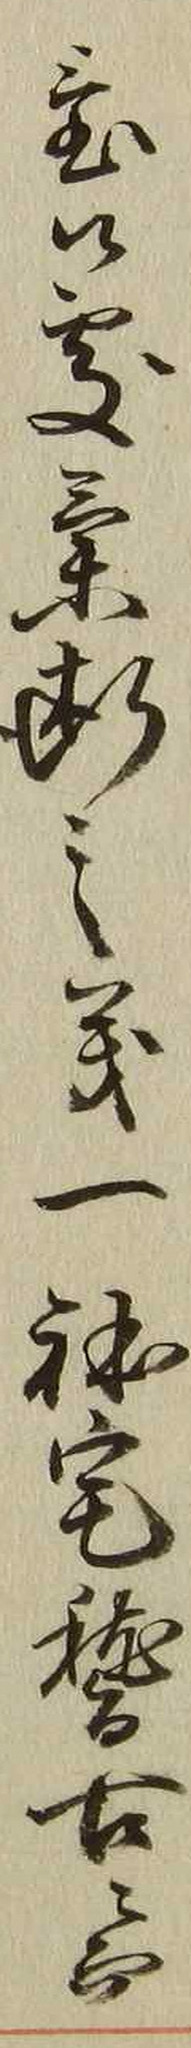置候処気術之義一体宅稽古ニ而
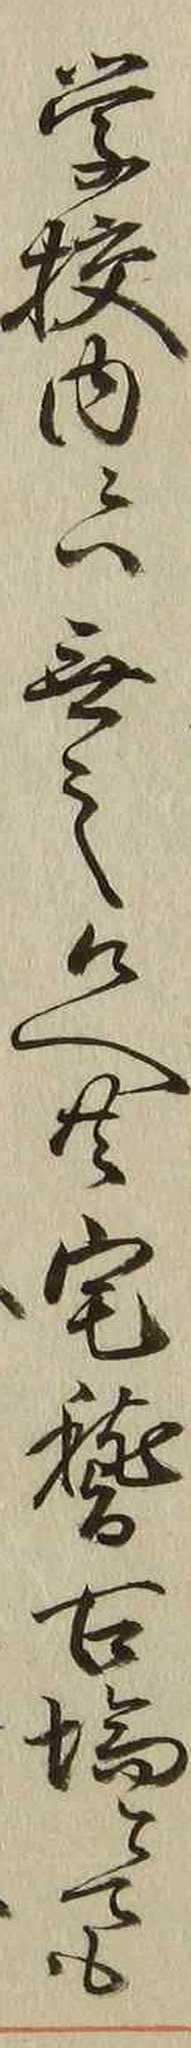学校内ニハ無之候へ共宅稽古場とても
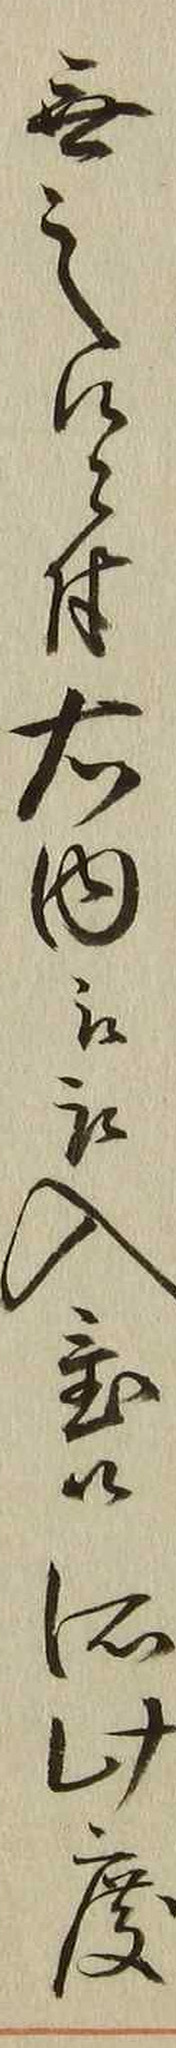無之候ニ付右内江被入置候所此度
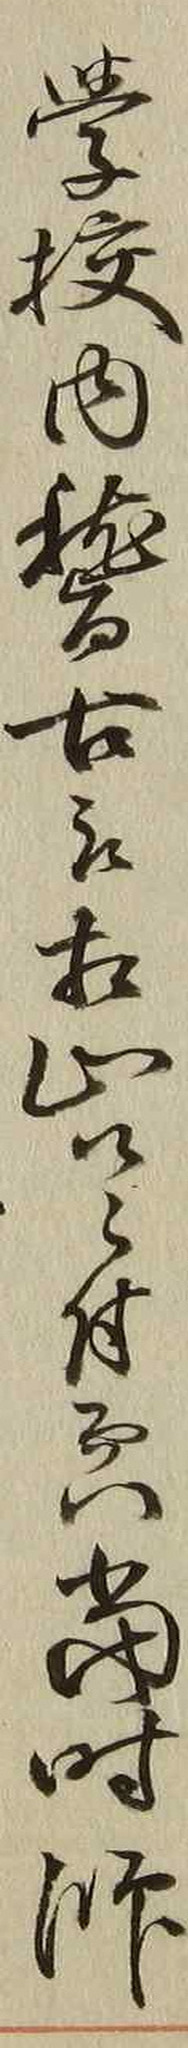学校内稽古被相止候ニ付而ハ当時師
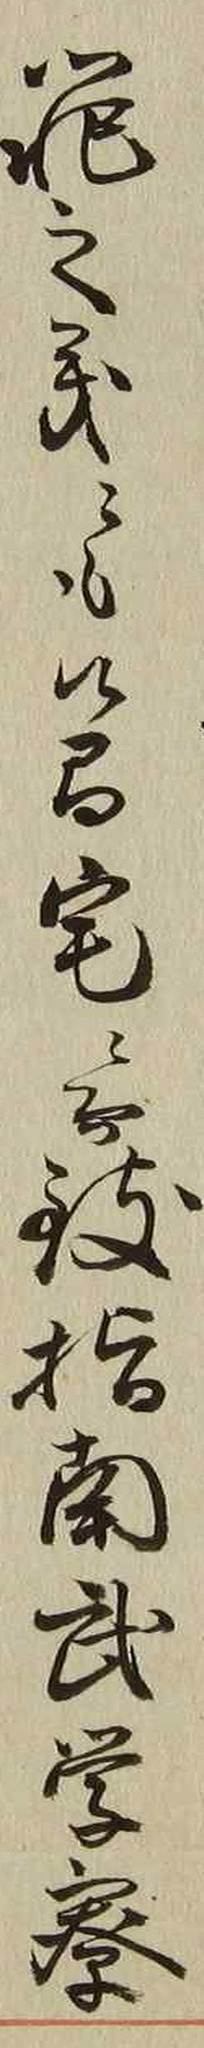範之義ニも候間宅ニ而致指南武学寮
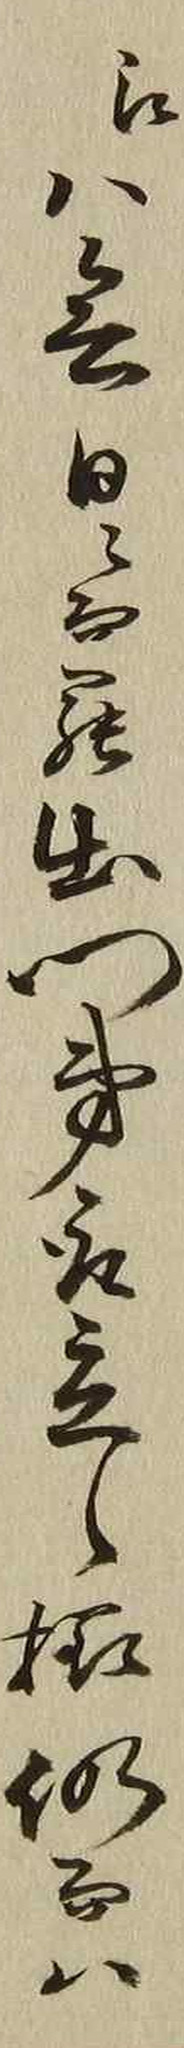江八月六日ニ而罷出門弟取立候様仍而ハ
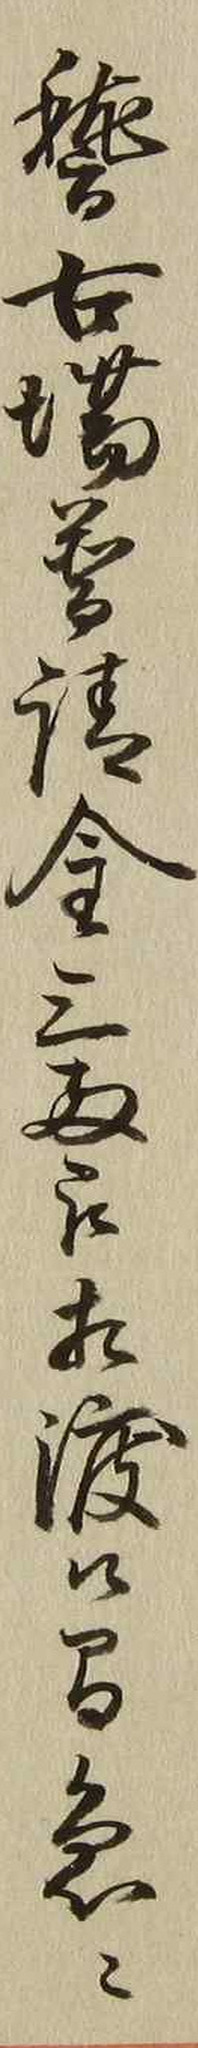稽古場普請金三両被相渡候間急ニ
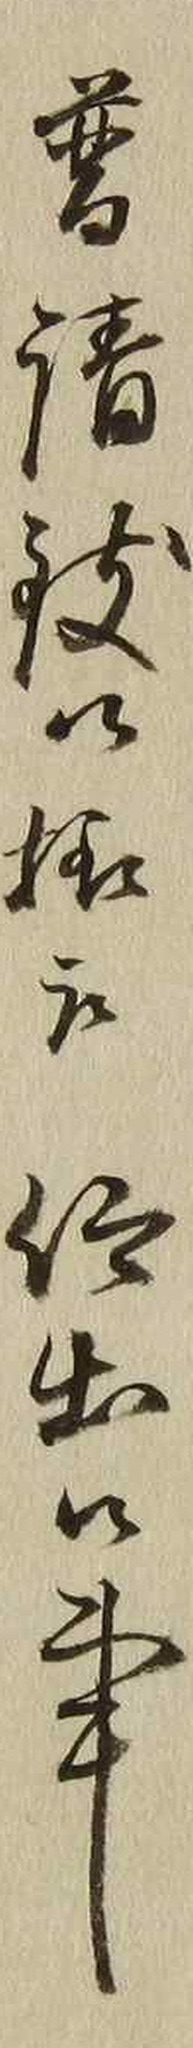普請致候様被仰出候事
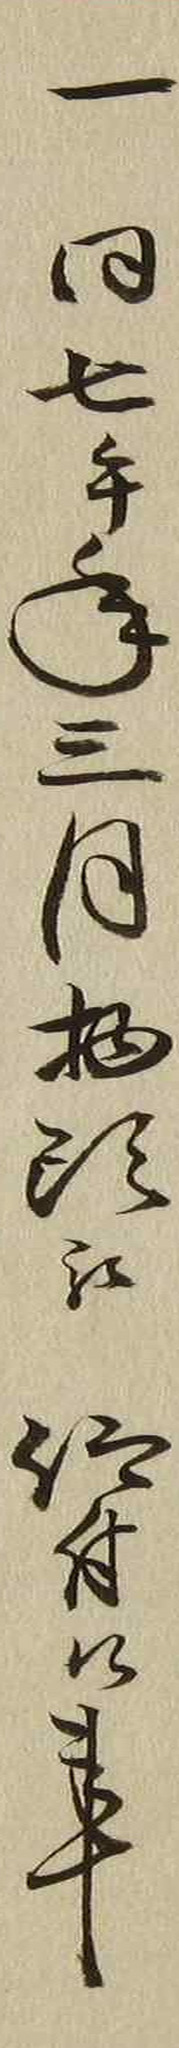一同七午年三月物頭被仰付候事
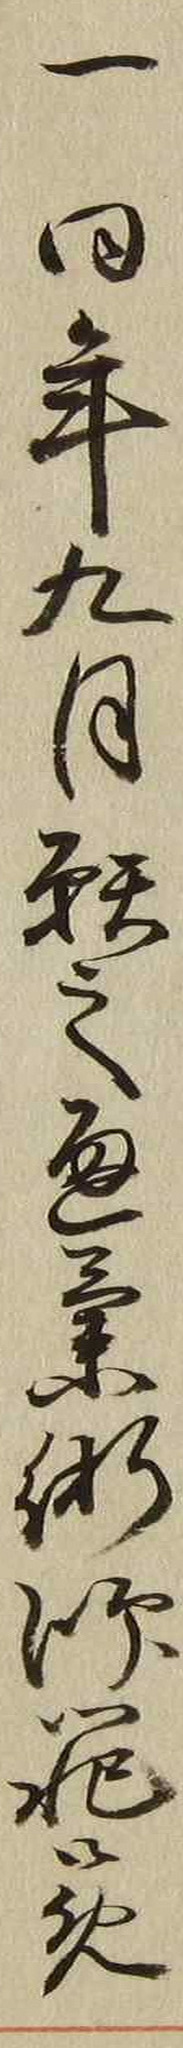一同年九月願之通気術師範御免
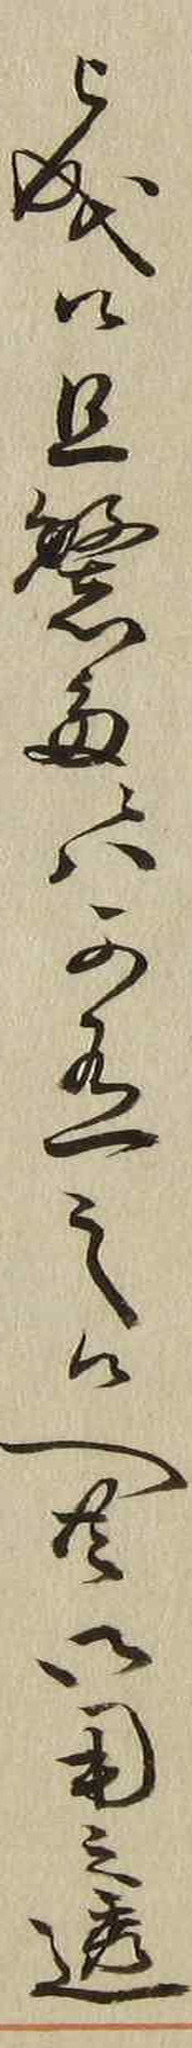被成候且繁多ニハ可有之候へ共御用之透
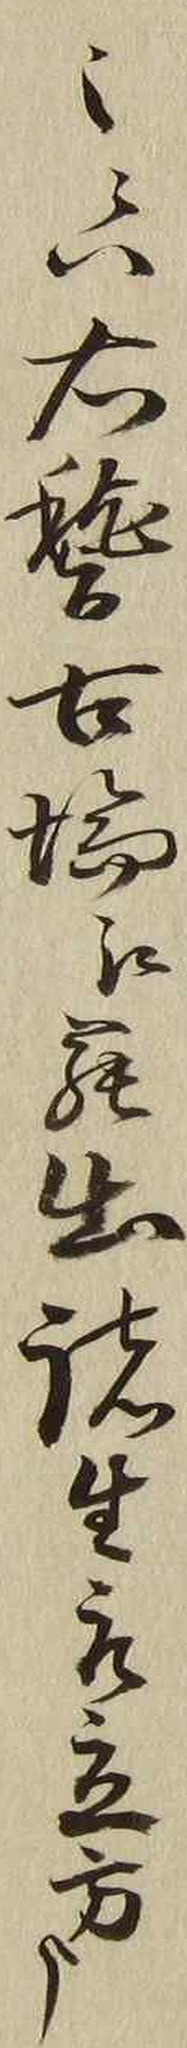之只右稽古場江罷出諸生取立方申
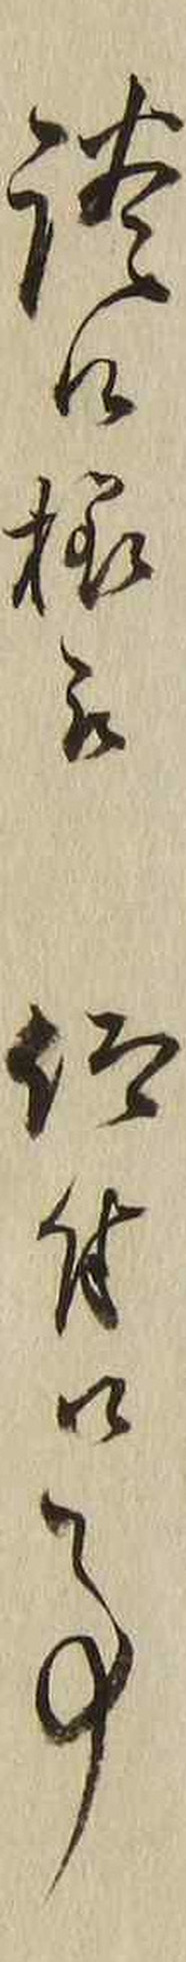談候様被仰付候事
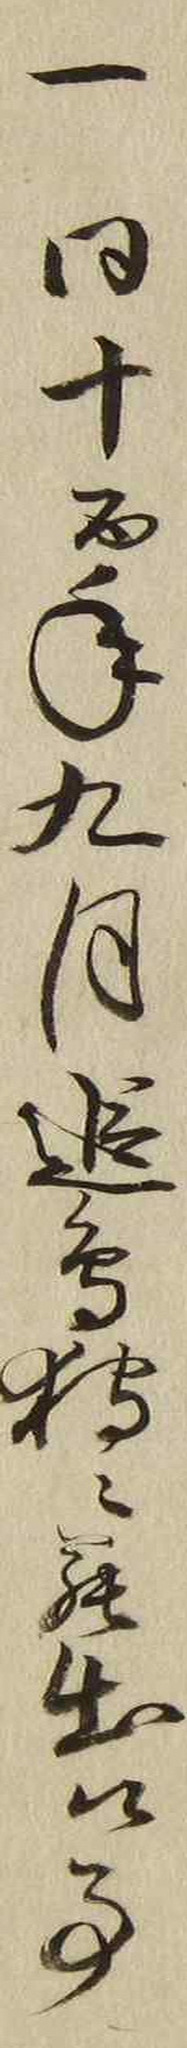一同十酉年九月追鳥狩ニ罷出候事
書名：諸士系譜　巻之60　と之部3
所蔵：会津若松市立会津図書館
